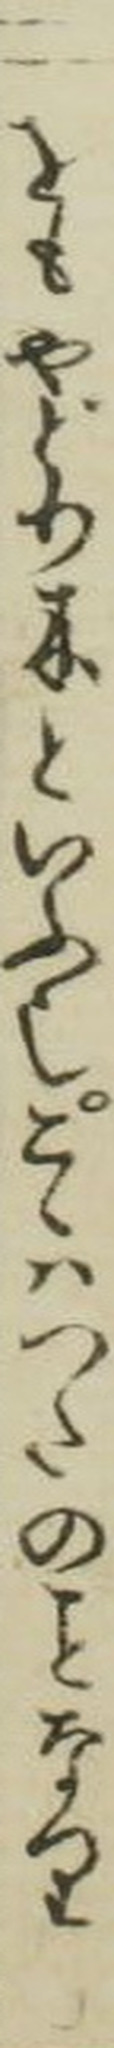をもやどり木といふ也。こゝはつたのことなり
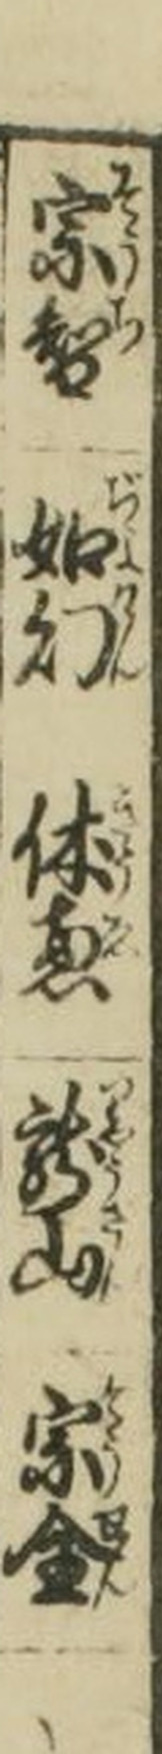宗智如幻休恵龍山宗全
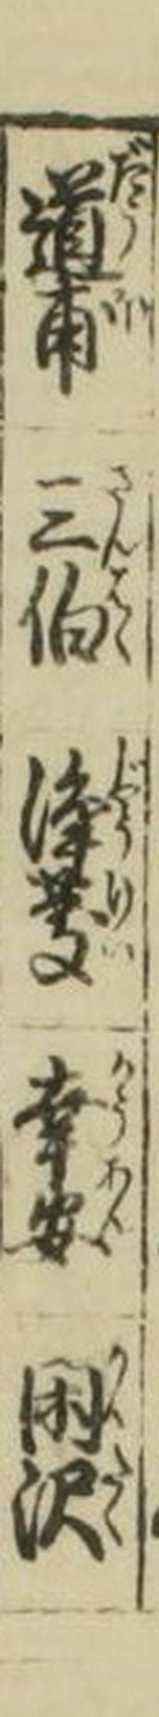道甫三伯浄慶幸安閑沢
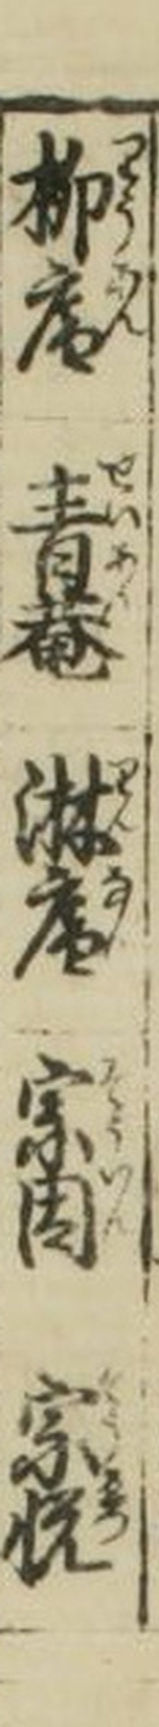柳庵青菴淋庵宗因宗悦
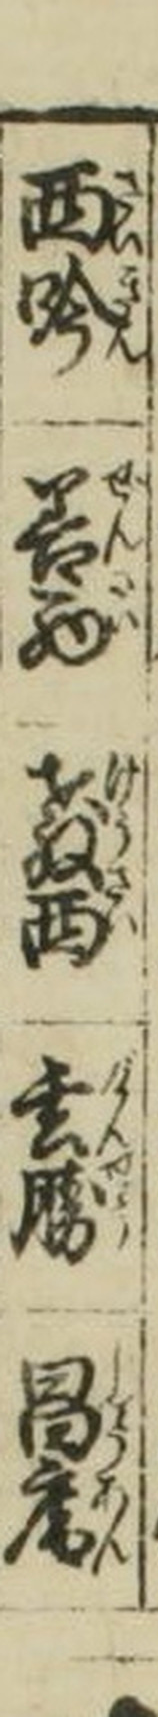西吟善西教西玄勝昌庵
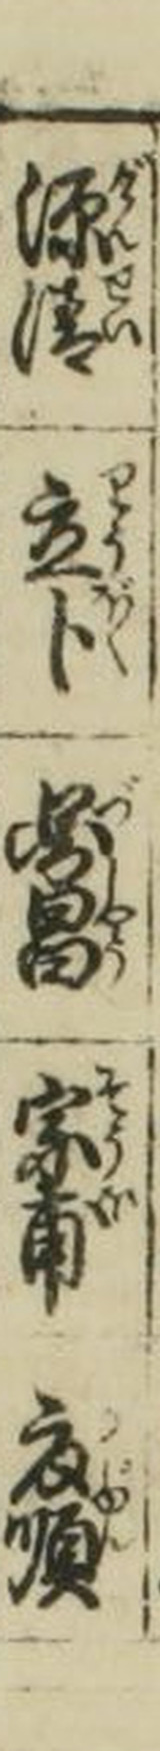源清立卜図昌宗甫夏順
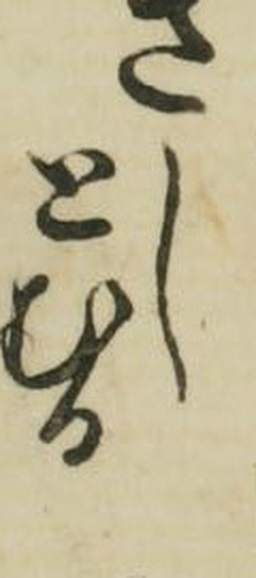とむる
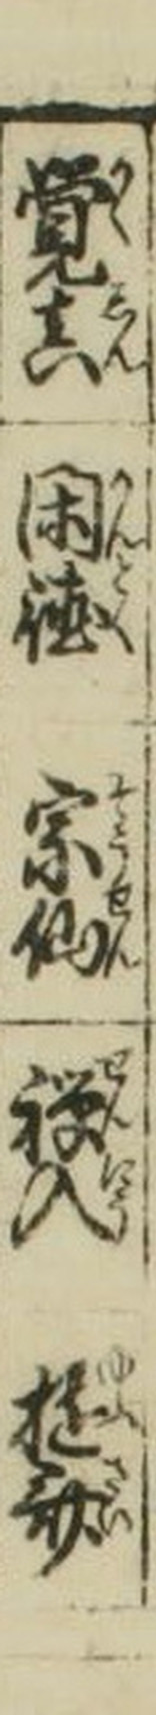覚真閑徳宗仙禅入遊斎
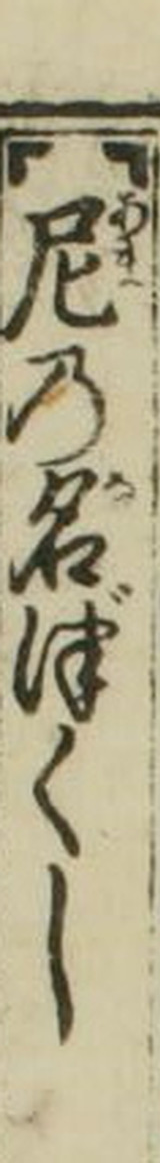尼の名づくし
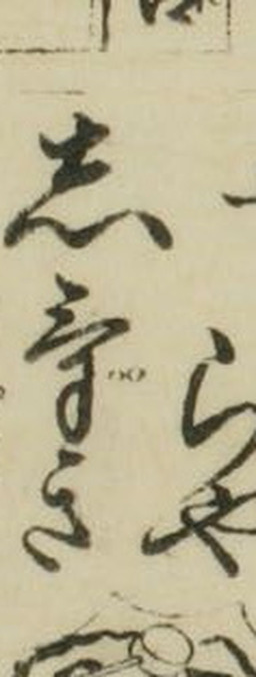しげき
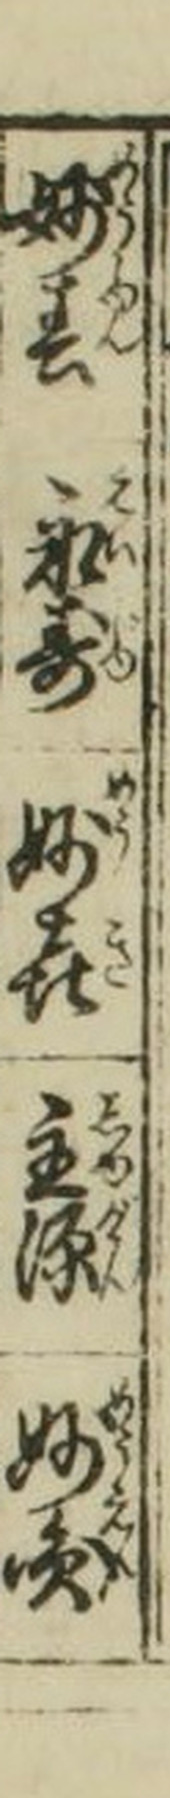妙春永寿妙喜主源妙円
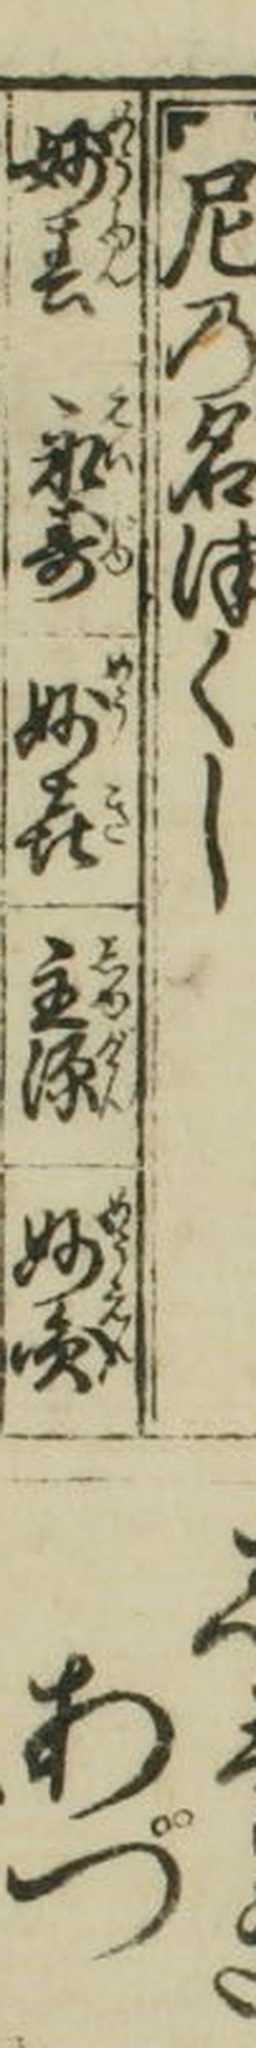妙春永寿妙喜主源妙円
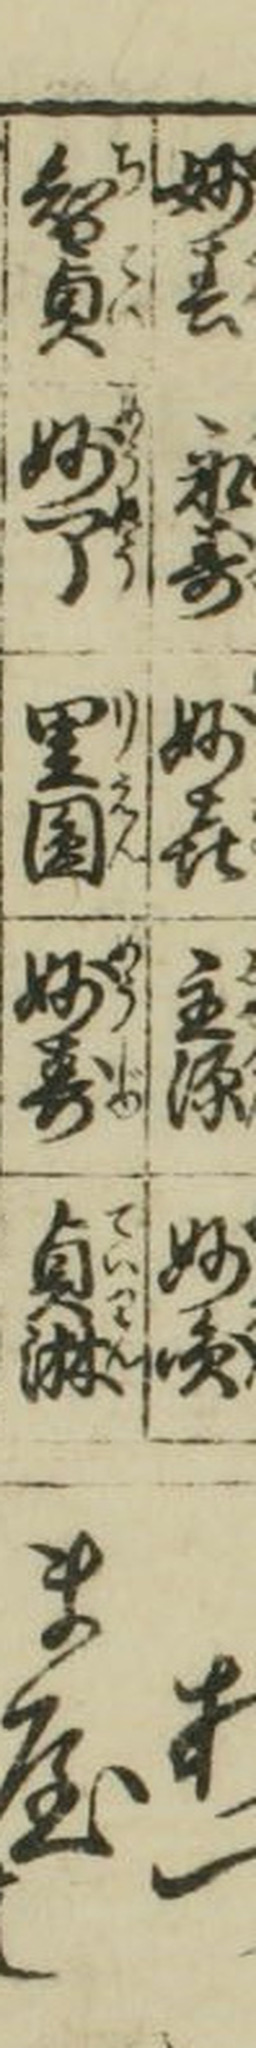智貞妙了里園妙寿貞淋
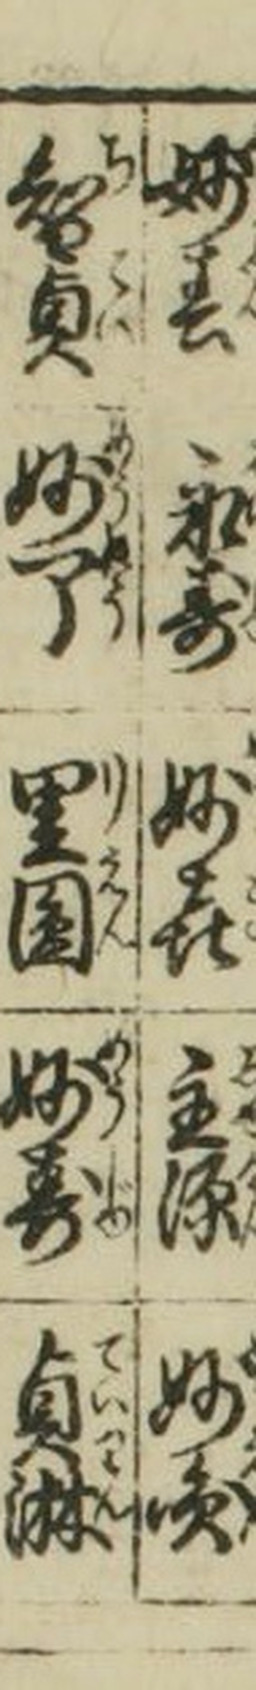智貞妙了里園妙寿貞淋
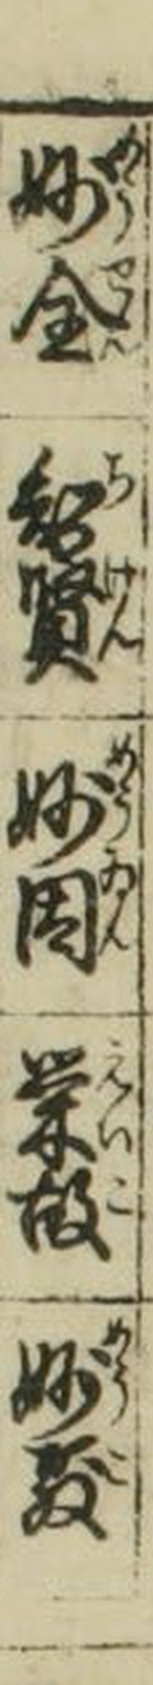妙全智賢妙因栄故妙散？
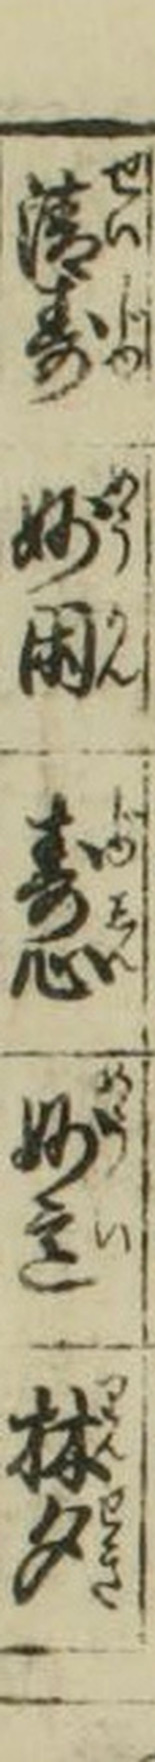清寿妙閑寿心妙意林夕
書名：女源氏教訓鑑
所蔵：東京学芸大学附属図書館
